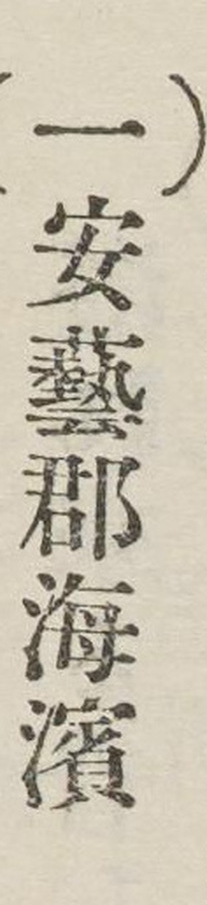安芸郡海濱
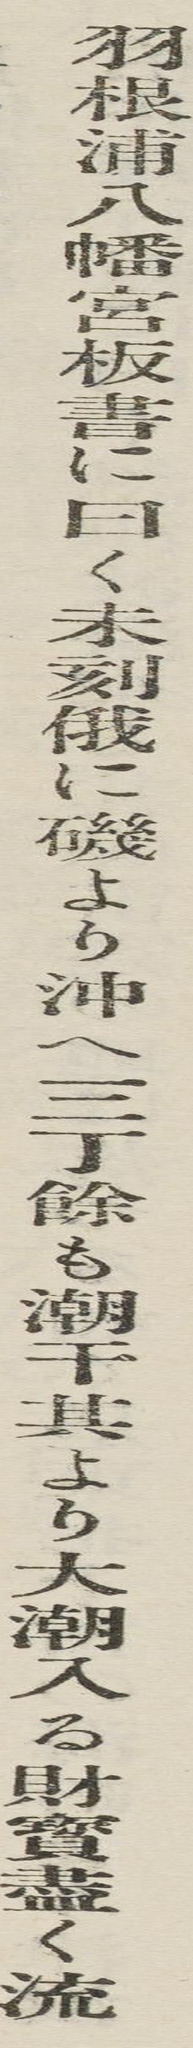羽根浦八幡宮板書に曰く未刻俄に磯より沖へ三丁餘も潮干其より大潮入る財宝盡く流
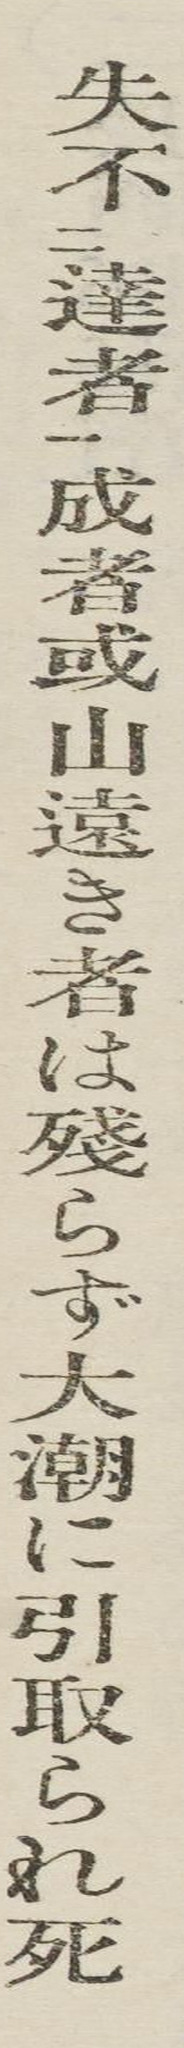失不達者成者或山遠き者は残らず大潮に引取られ死

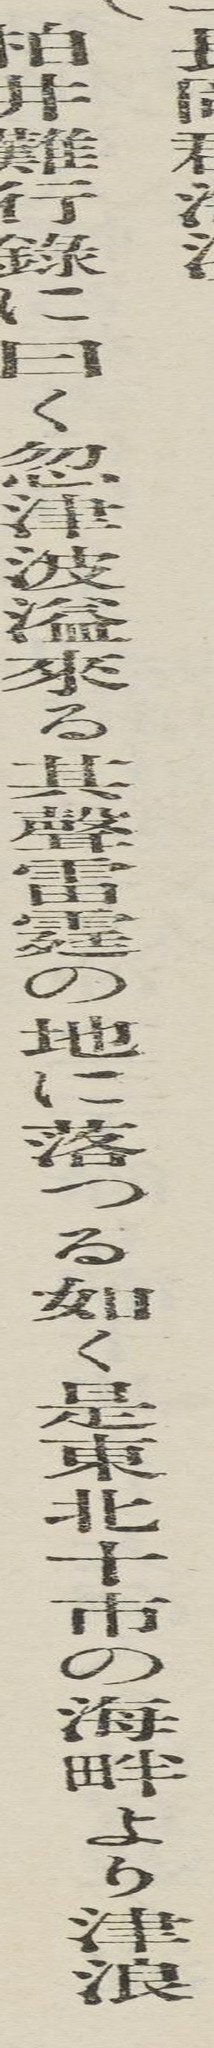柏井難行録に曰く忽津波溢来る其声雷霆の地に落つる如く是東北十市の海畔より津浪
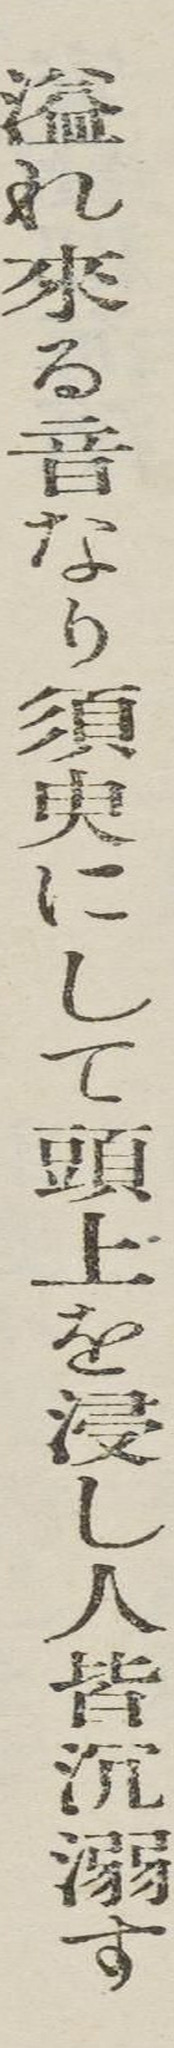溢れ来る音なり須叟にして頭上を浸し人皆沉溺す
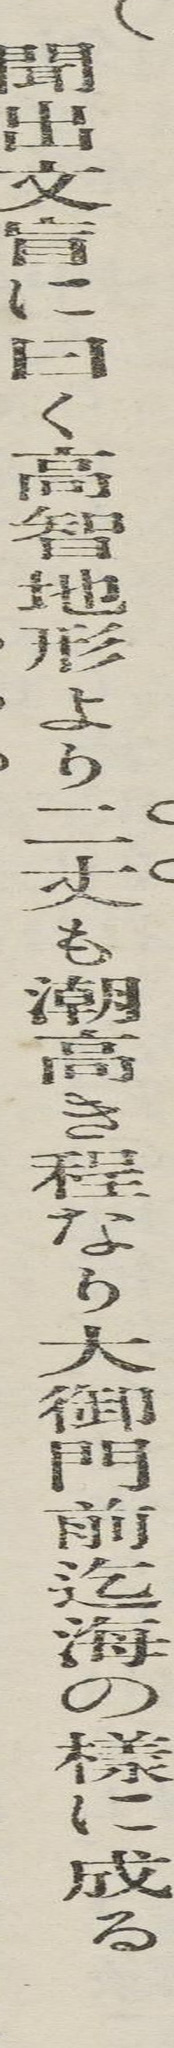聞出文盲に曰く高智地形より二丈も潮高き程なり大御門前迄海の様に成る
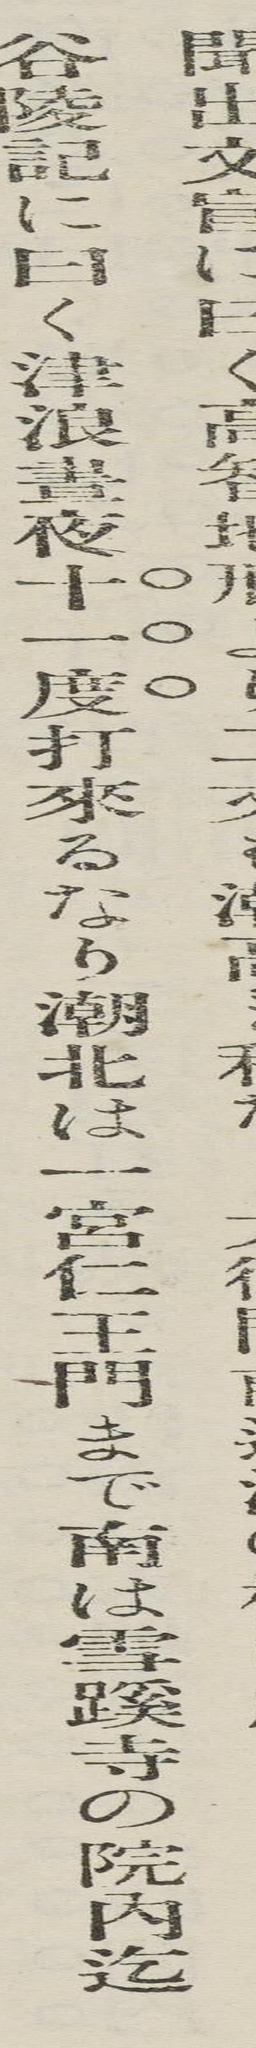谷陵記に曰く津浪昼夜十一度打来るなり潮北は一宮仁王門まで南は雪蹊寺の院内迄
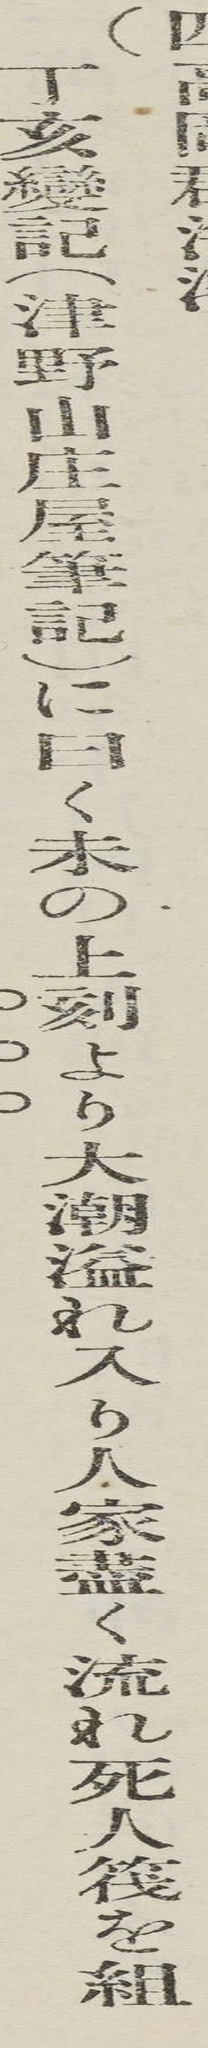丁亥変記に曰く未の上刻より大潮溢れ入り人家尽く流れ死人筏を組
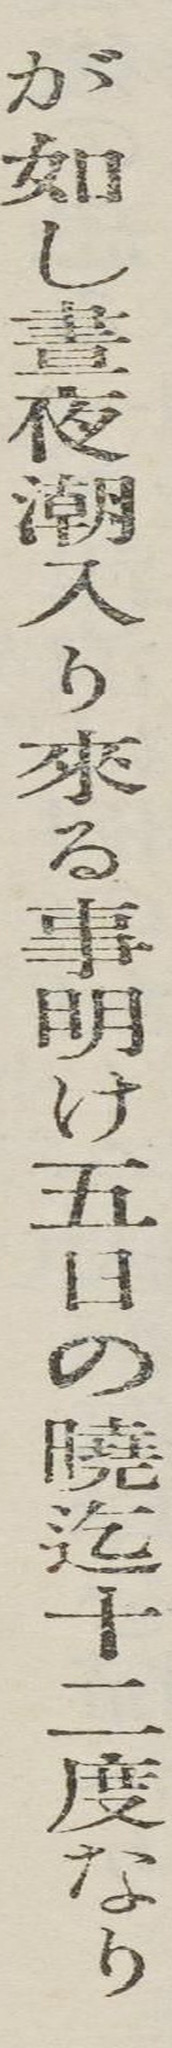が如し昼夜潮入り来る事明け五日の暁迄十二度なり
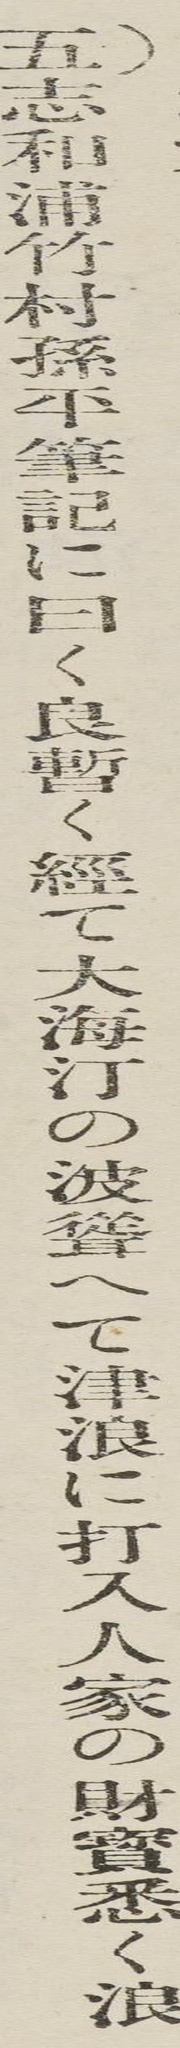㈤志和浦竹村孫平筆記に曰く良暫く経て大海汀の波聳へて津浪に打入人家の財宝悉く浪
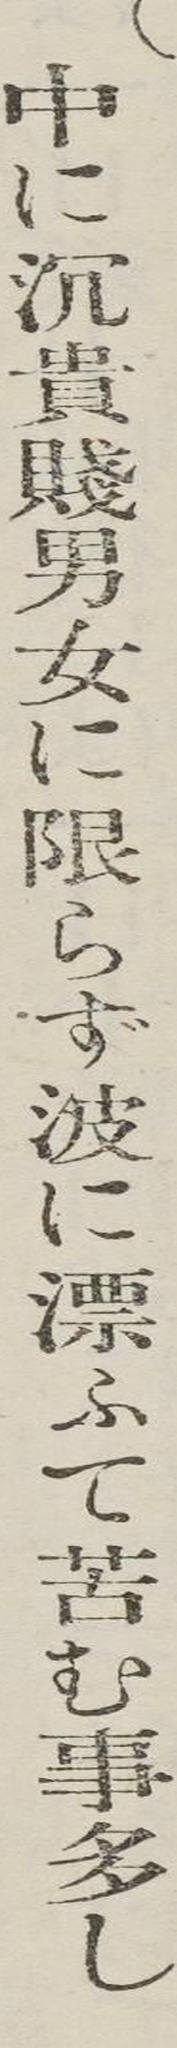中に沉貴賤男女に限らず波に漂ふて苦む事多し
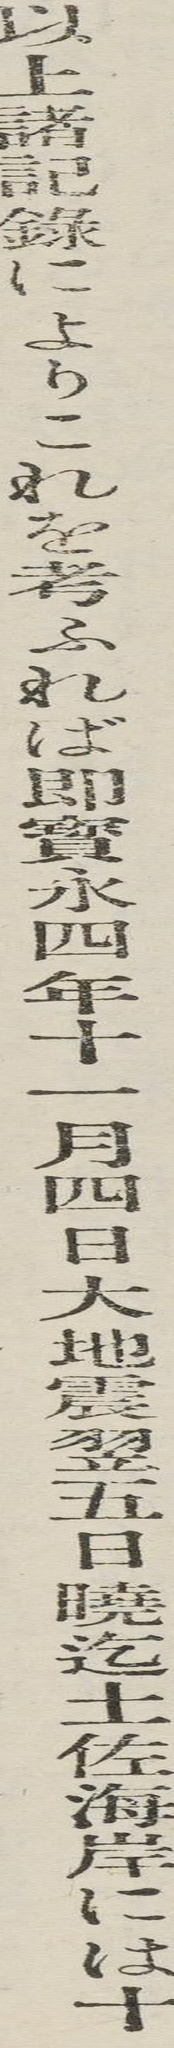以上諸記録によりこれを考ふれば即宝永四年十一月四日大地震翌五日暁迄土佐海岸には十
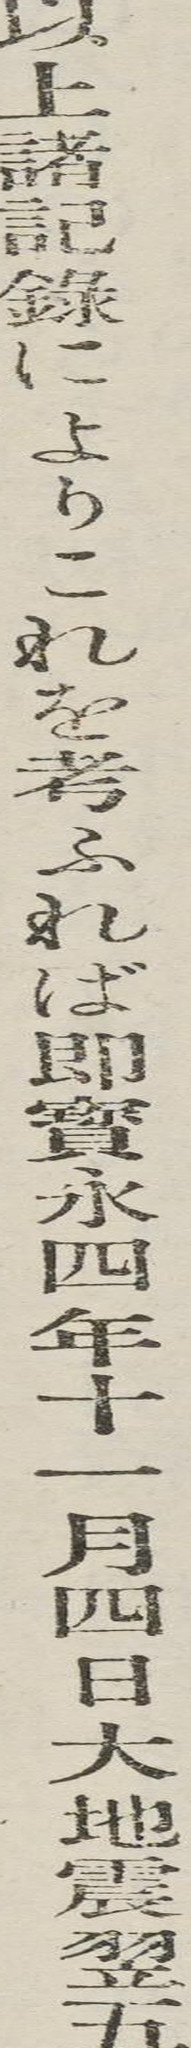以上諸記録によりこれを考ふれば即宝永四年十一月四日大地震翌五日暁迄土佐海岸には十
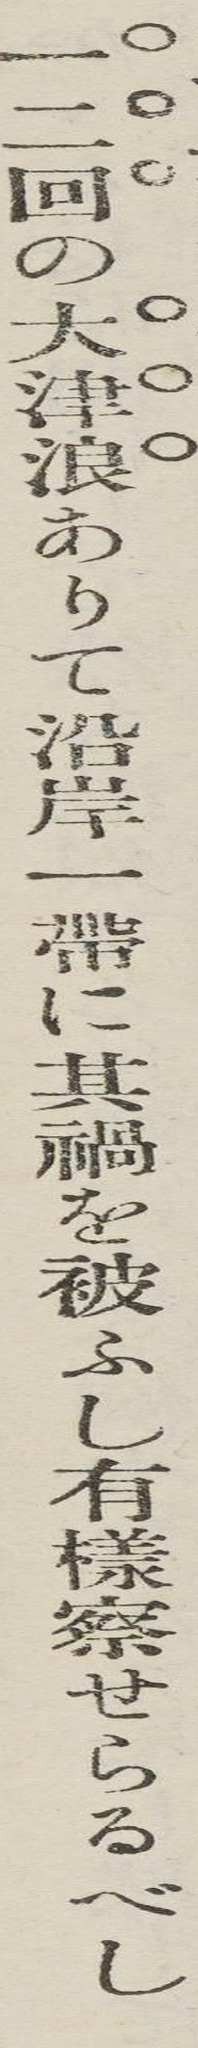一二回の大津波ありて沿岸一帯に其禍を被ふし有様察せらるべし
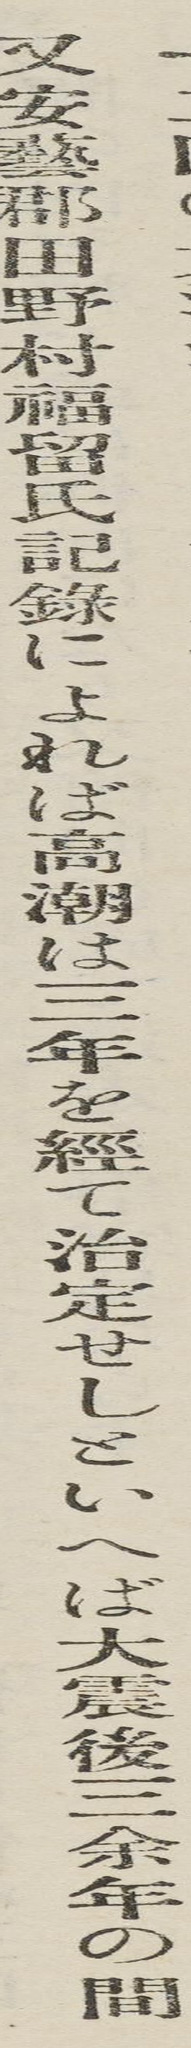又安芸郡田野村福留氏記録によれば高潮は三年を経て治定せしといへば大震後三余年の間
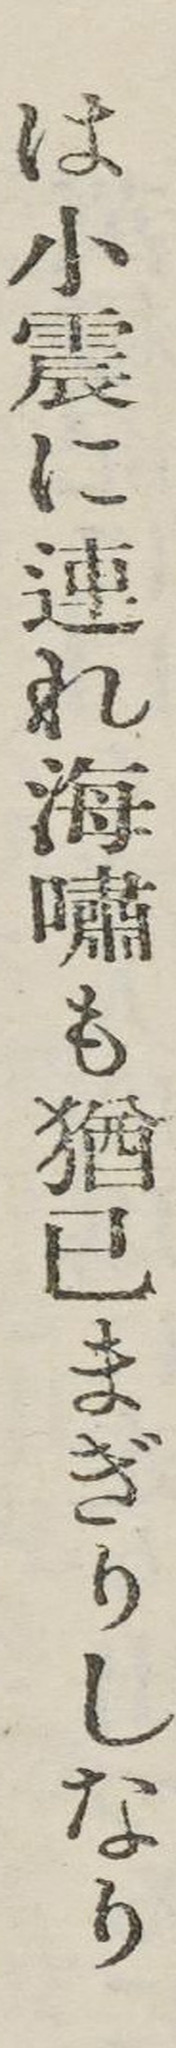は小震に連れ海嘯も猶已まぎりしなり
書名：土佐古今ノ地震
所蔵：東京大学地震研究所図書室 Earthquake Research Institute Library, The University of Tokyo, JAPAN
